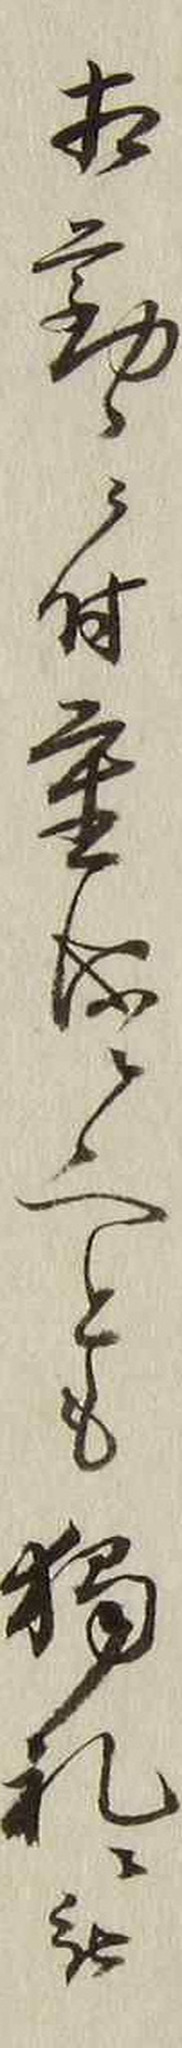相勤候ニ付重儀ニ候へとも独礼ニ被
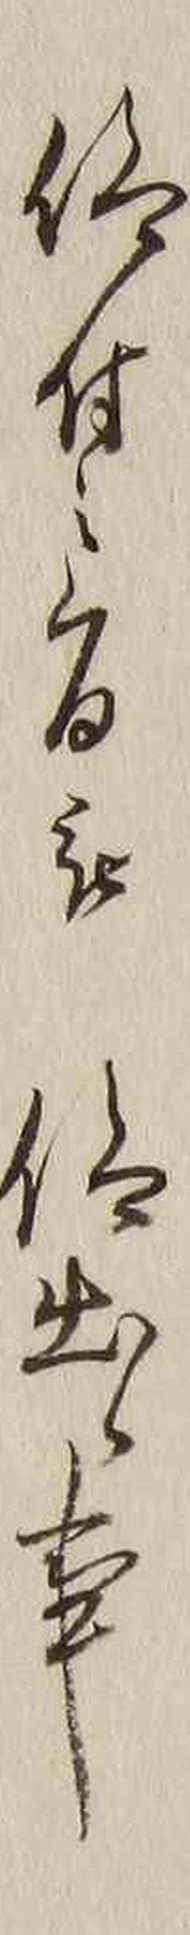仰付之旨被仰出候事
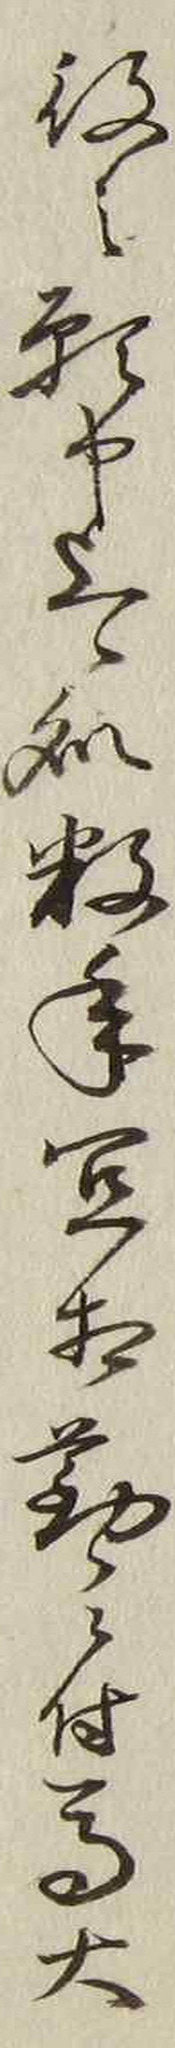役之願申上候処数年宜相勤候ニ付馬大
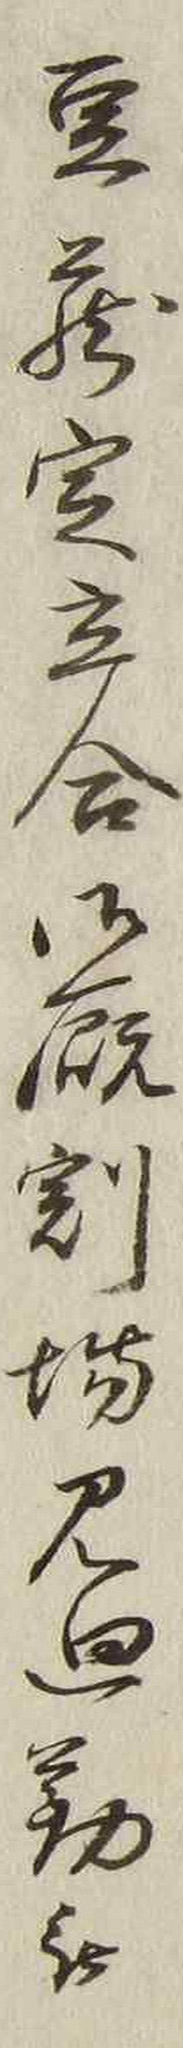豆蔵定立合御厩割場見廻勤被
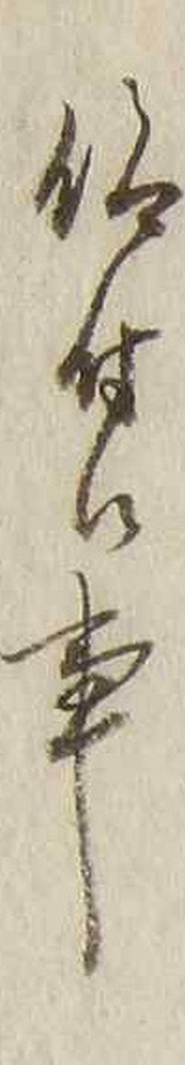仰付候事

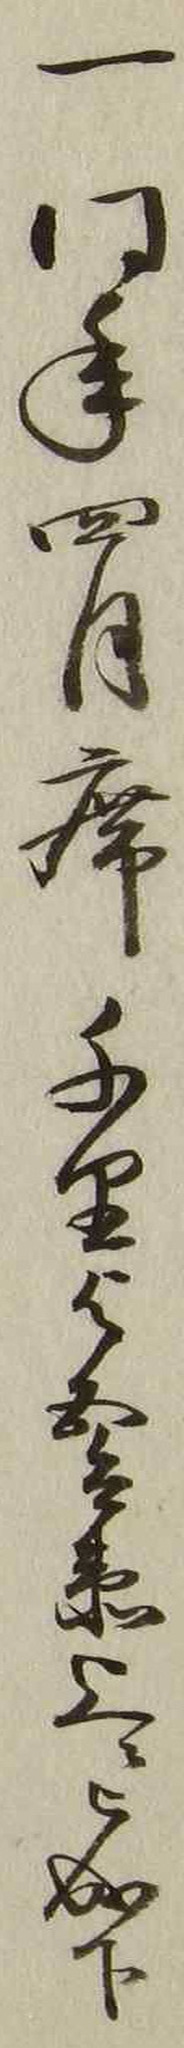一同年四月席千里与五兵衛上ニ被成下
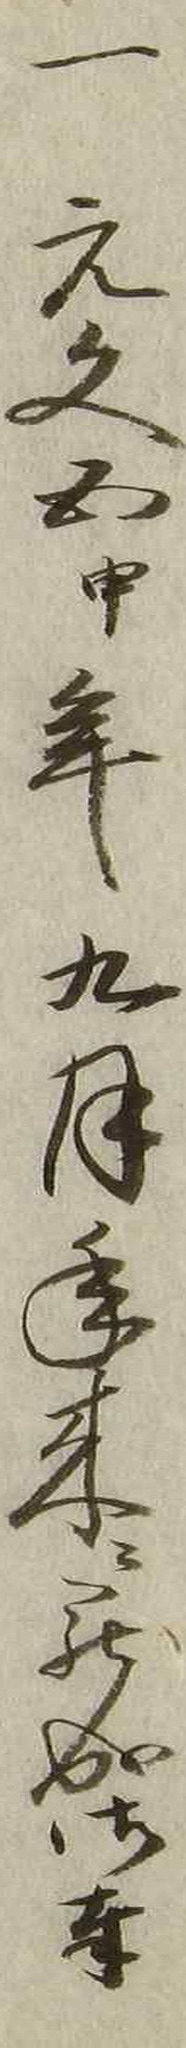一元文五申年九月年来ニ罷成御奉
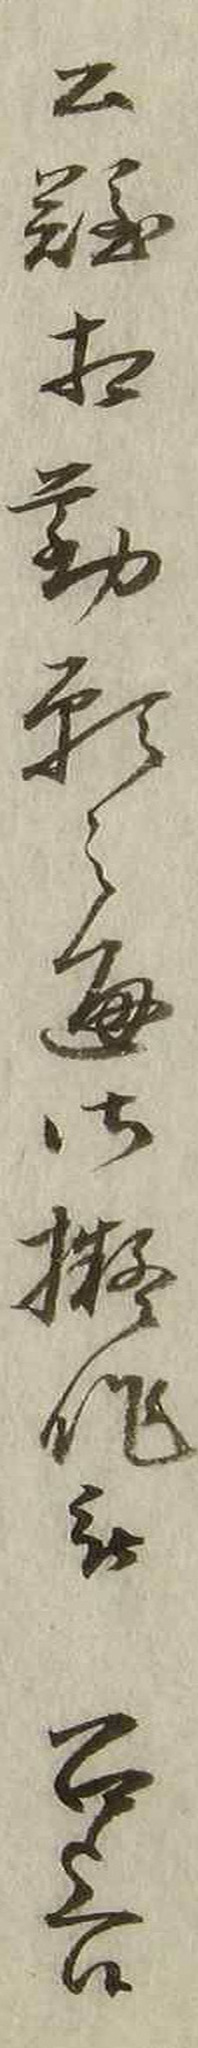公難相勤願之通御擬作被召上候
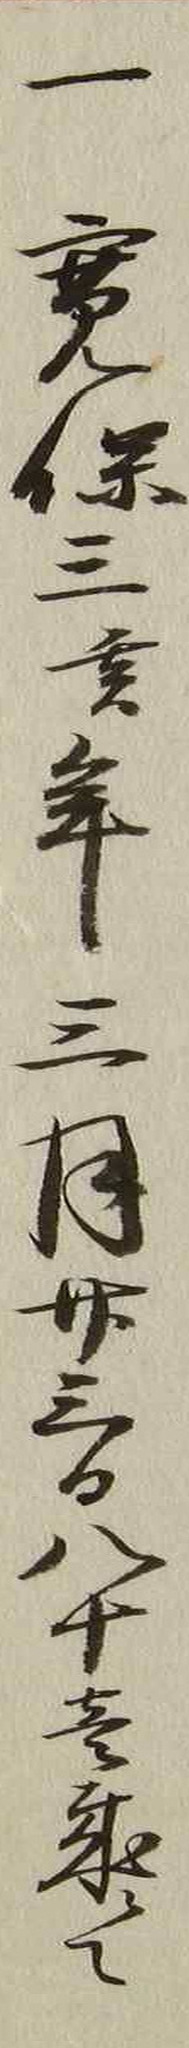一寛保三亥年三月廿三日八十壱歳ニて
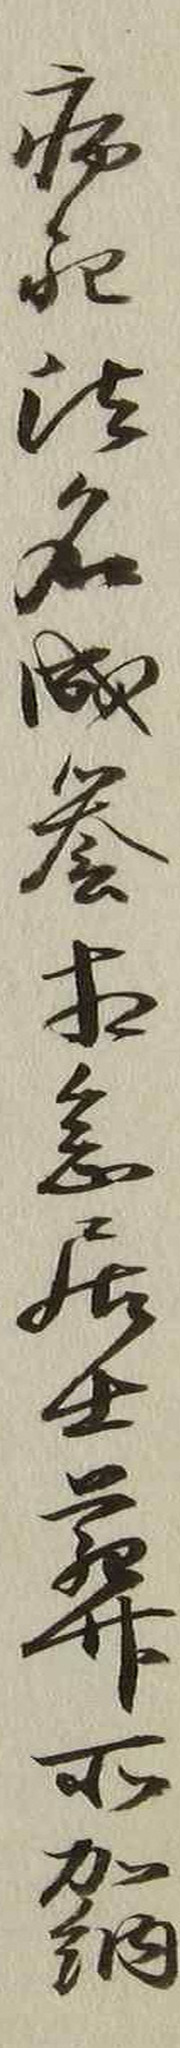病死法名成誉相念居士葬所加納
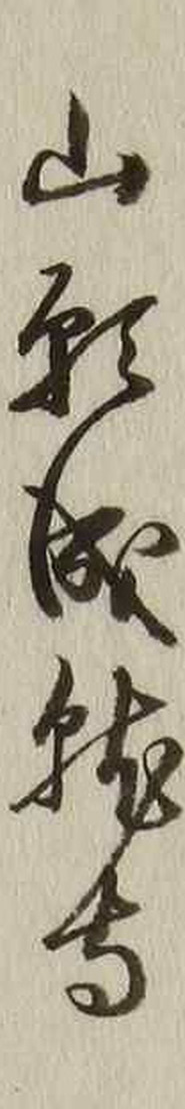山願成就寺
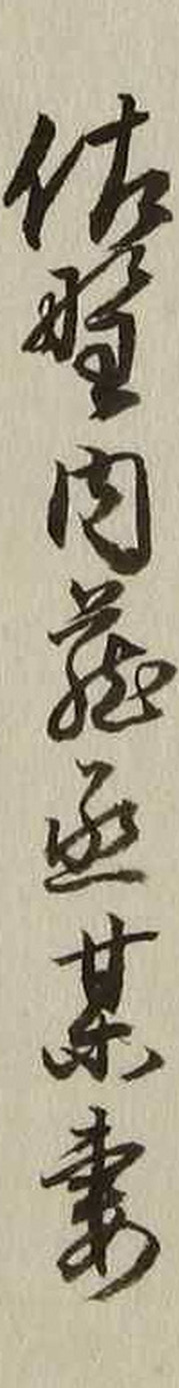女佐野内蔵丞某妻
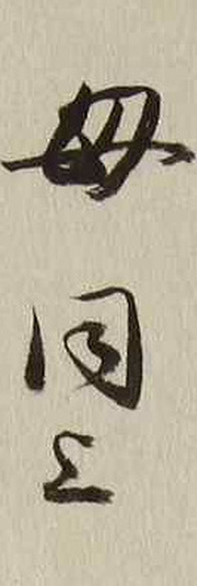母同上
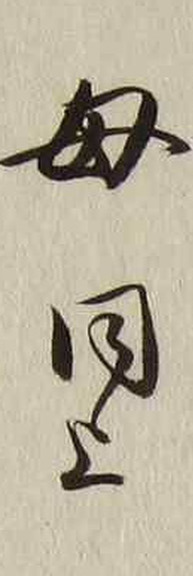母同上
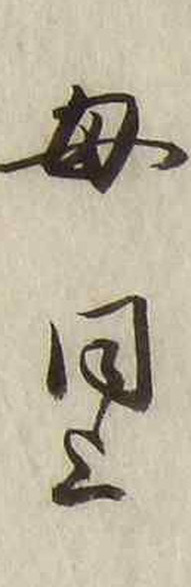母同上

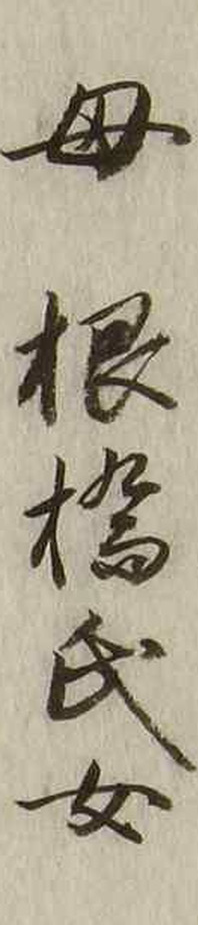母根橋氏女
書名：諸士系譜　巻之102　か之部10
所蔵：会津若松市立会津図書館
